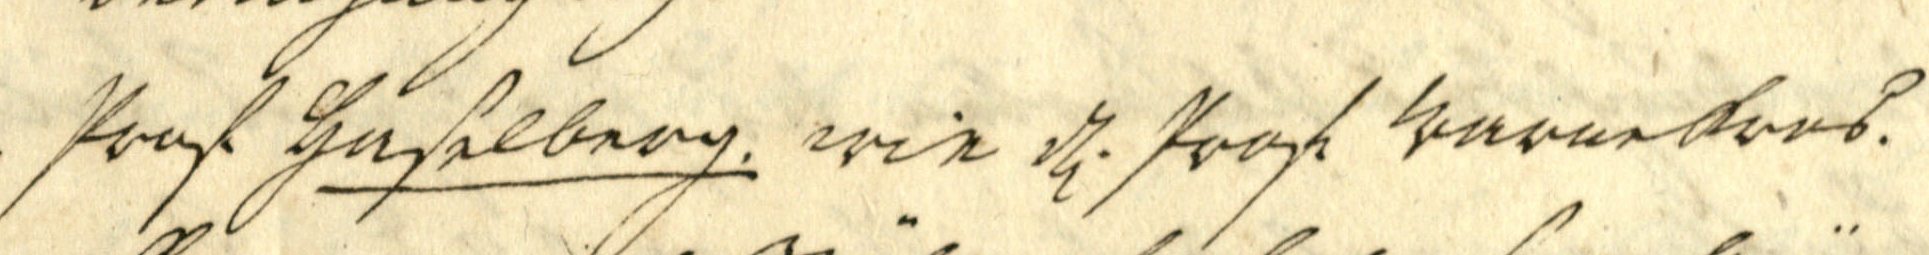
Prof. Haselberg. wie dh. Prof. Warnekros.
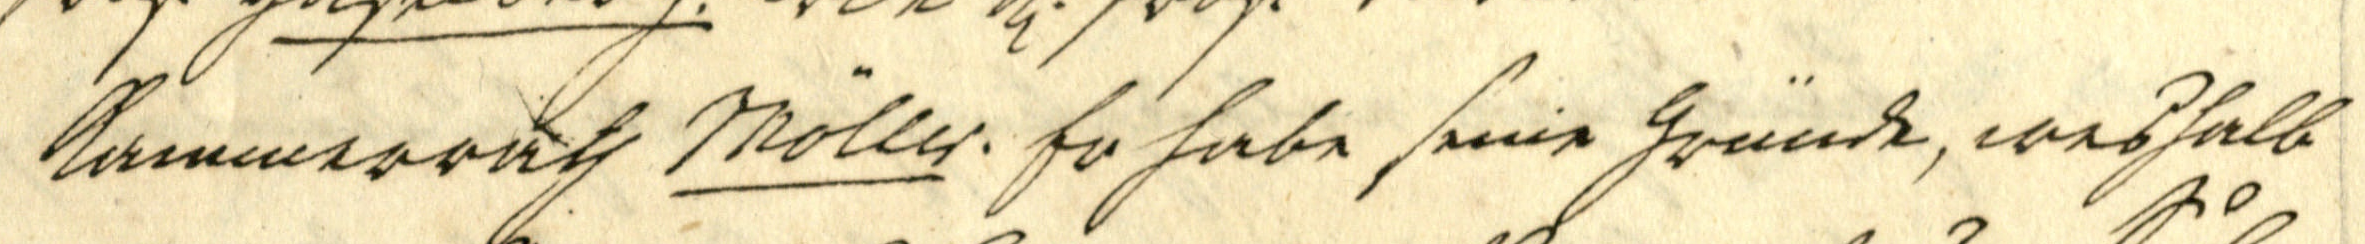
Kammerrath Möller. Er habe seine Gründe, weshalb
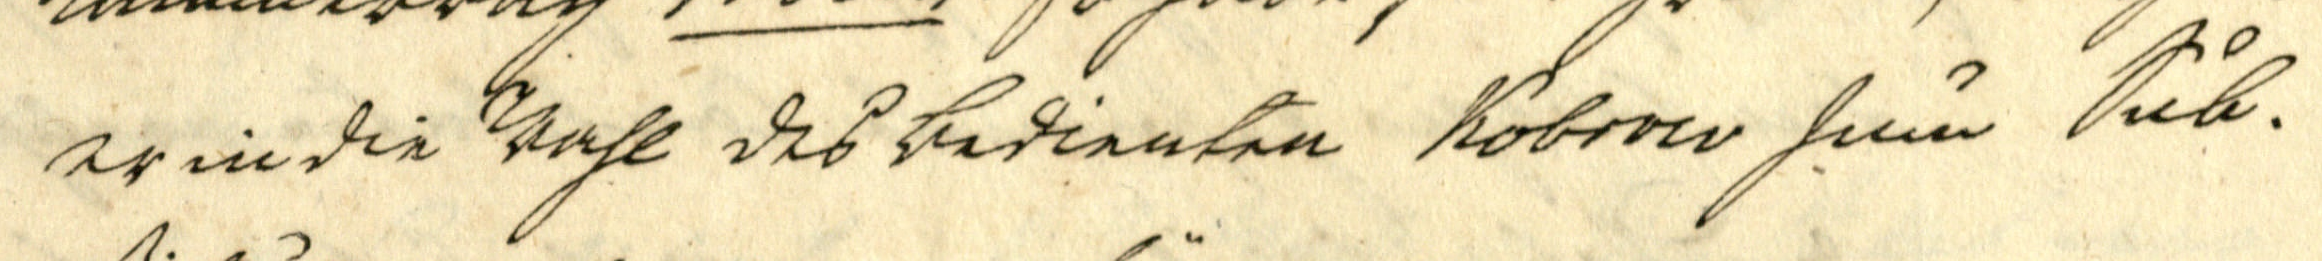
er in die Wahl des Bedienten Kobrow zum Sub¬
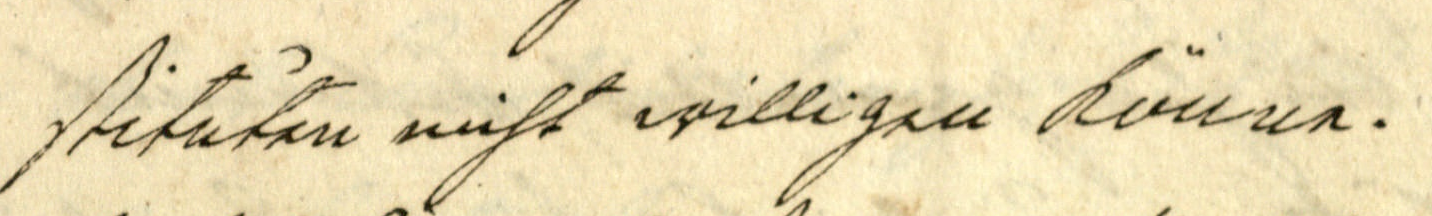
stituten nicht willigen könne.
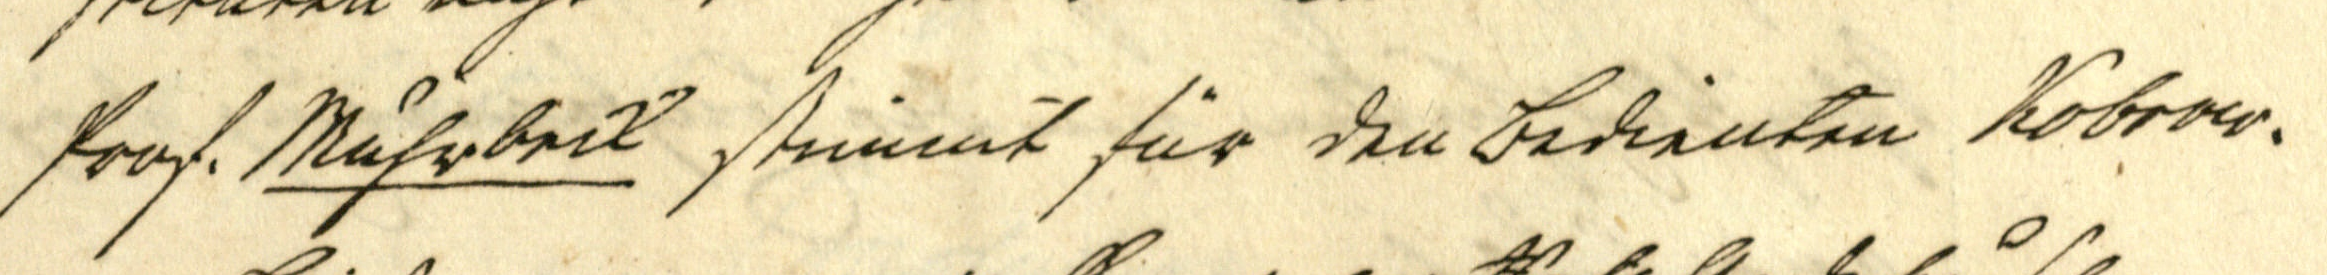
Prof. Muhrbeck stimmt für den Bedienten Kobrow.
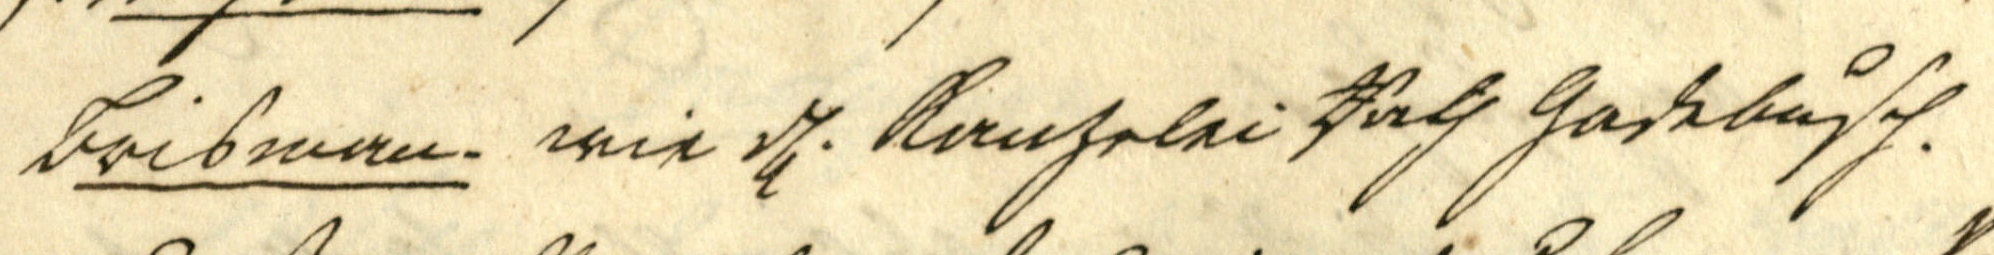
Brismann wie dh. Kanzelei Rath Gadebusch.
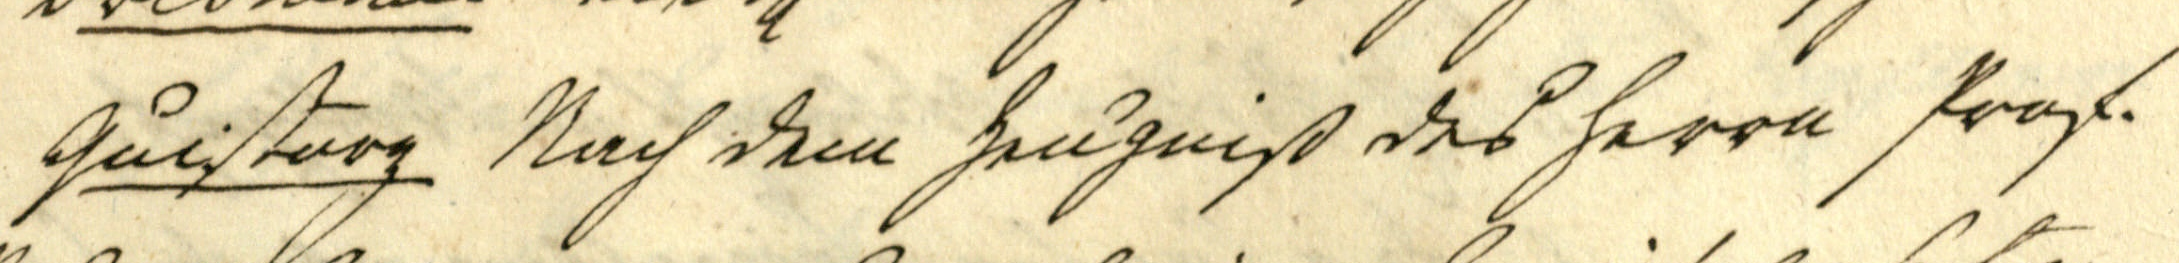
Quistorp Nach dem Zeugniß des Herrn Prof.
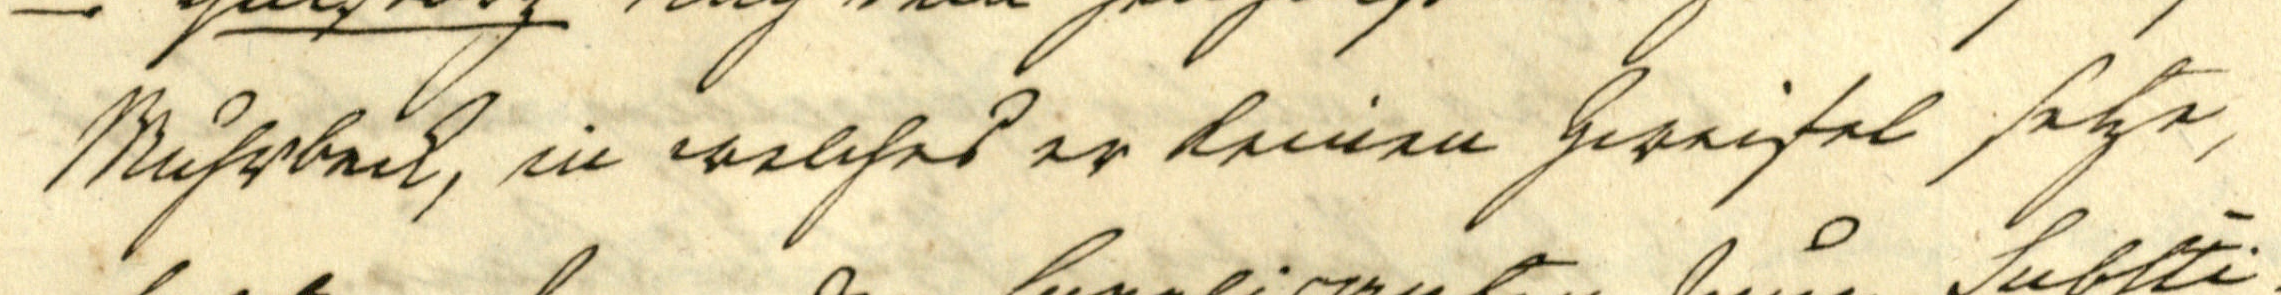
Muhrbeck, in welches er keinen Zweifel setze,
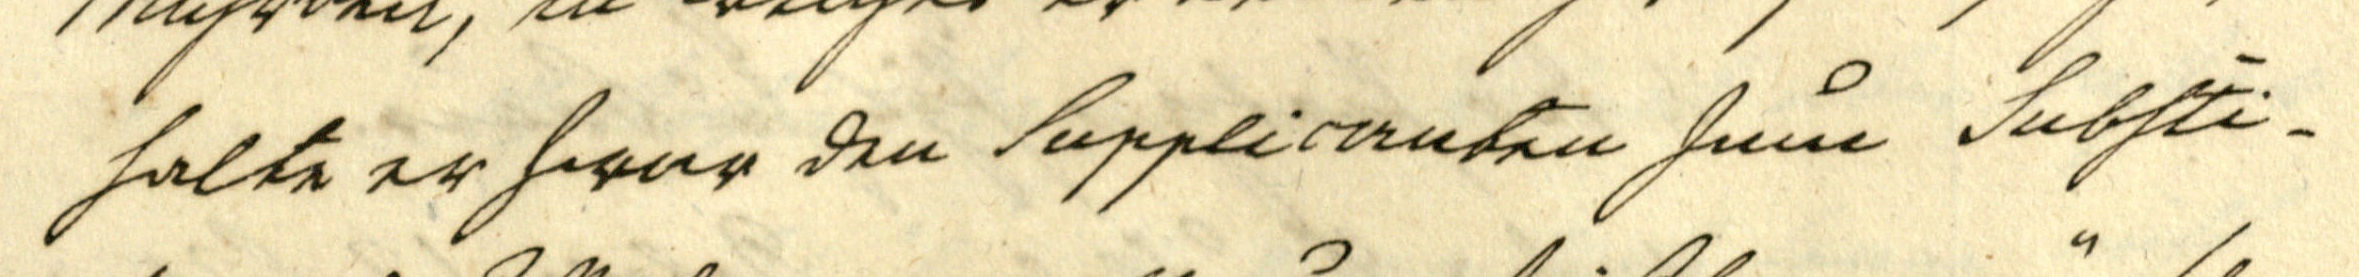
halte er zwar den Supplicanten zum Substi¬
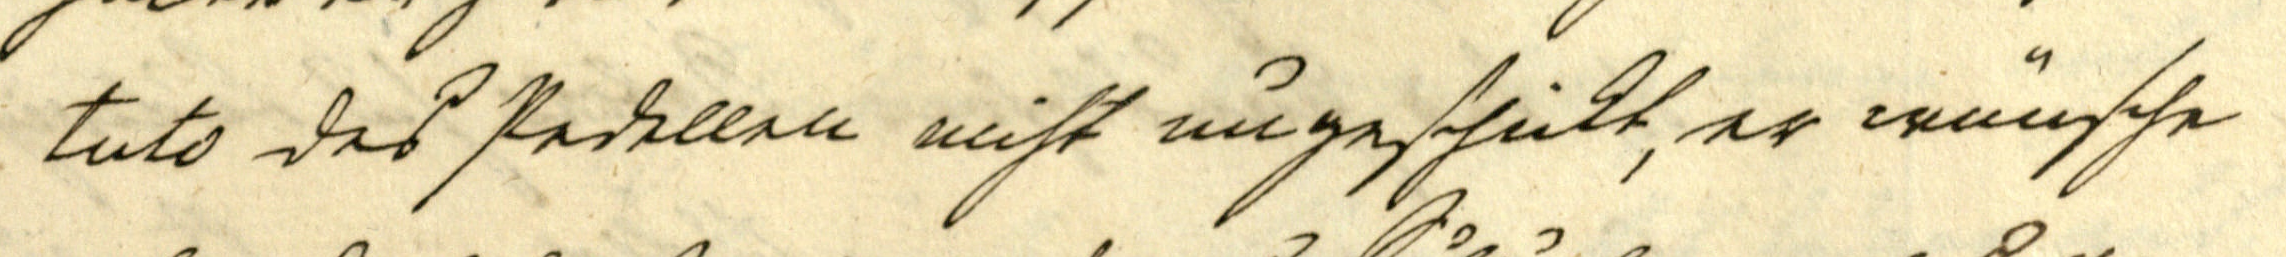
tuto des Pedellen nicht ungeschickt, er wünsche
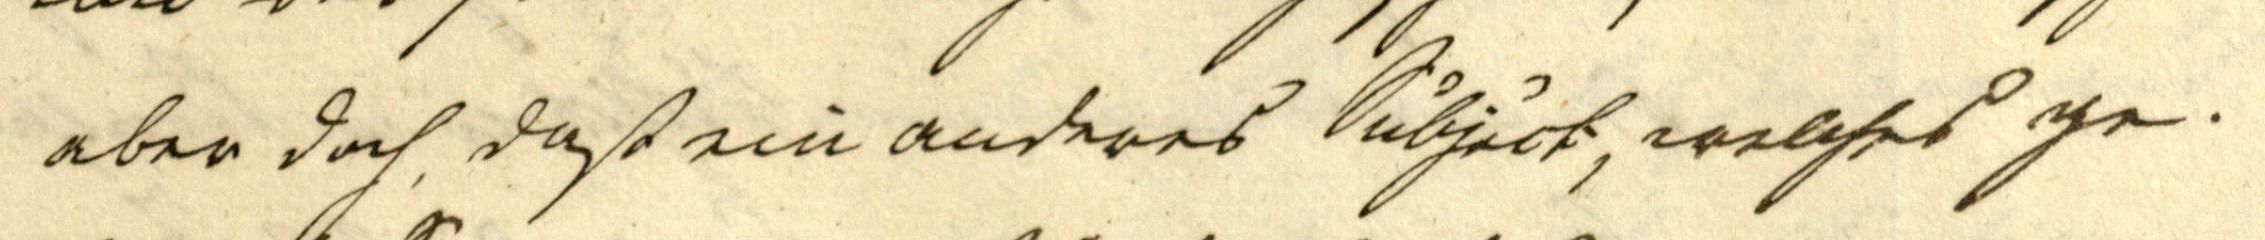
aber doch, daß ein anderes Subject, welches ge
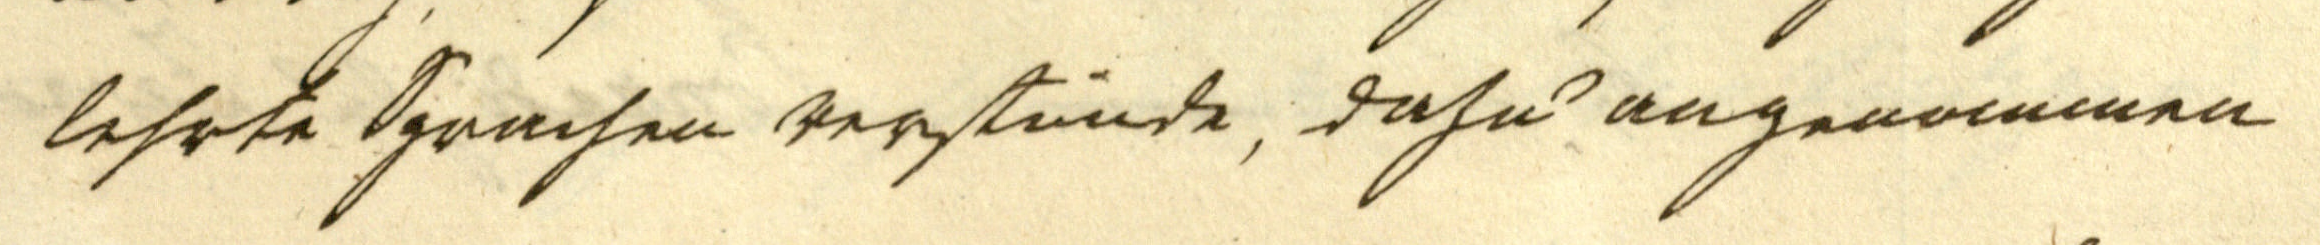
lehrte Sprachen verstünde, dazu angenommen
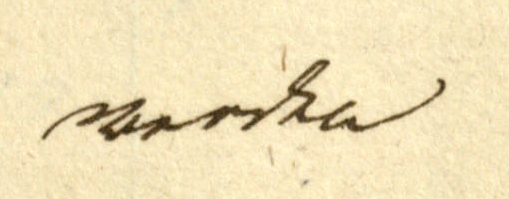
werden
